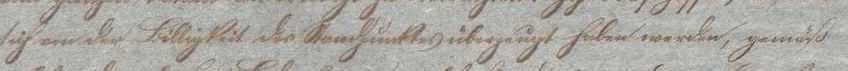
sich von der Billigkeit des Standpunktes überzeugt haben werden, gemäß
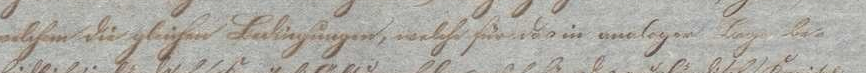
welchem die gleichen Bedingungen, welche für das in analoger Lage be-
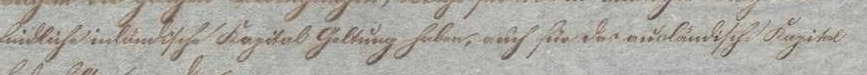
findliche inländische Kapital Geltung haben, auch für das ausländische Kapital
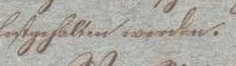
festgehalten werden.
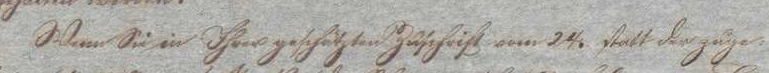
Wenn Sie in Ihrer geschätzten Zuschrift vom 24. statt der zuge-
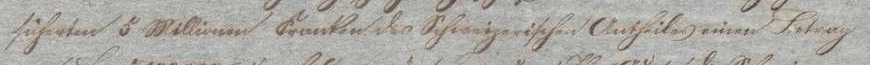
führten 5 Millionen Franken des Schweizerischen Antheiles einen Betrag
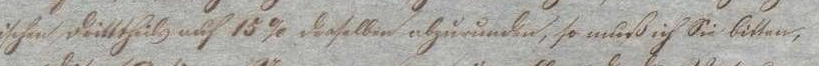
ischen Dritttheils auf 15% desselben abzurunden, so muß ich Sie bitten,
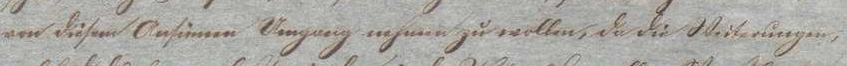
von diesem Ansinnen Umgang nehmen zu wollen, da die Weiterungen,
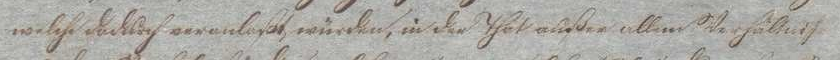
welche dadurch veranlaßt würden, in der That außer allem Verhältnisse
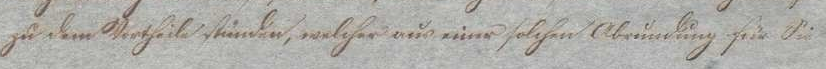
zu dem Vortheile stünden, welcher aus einer solchen Abrundung für Sie
